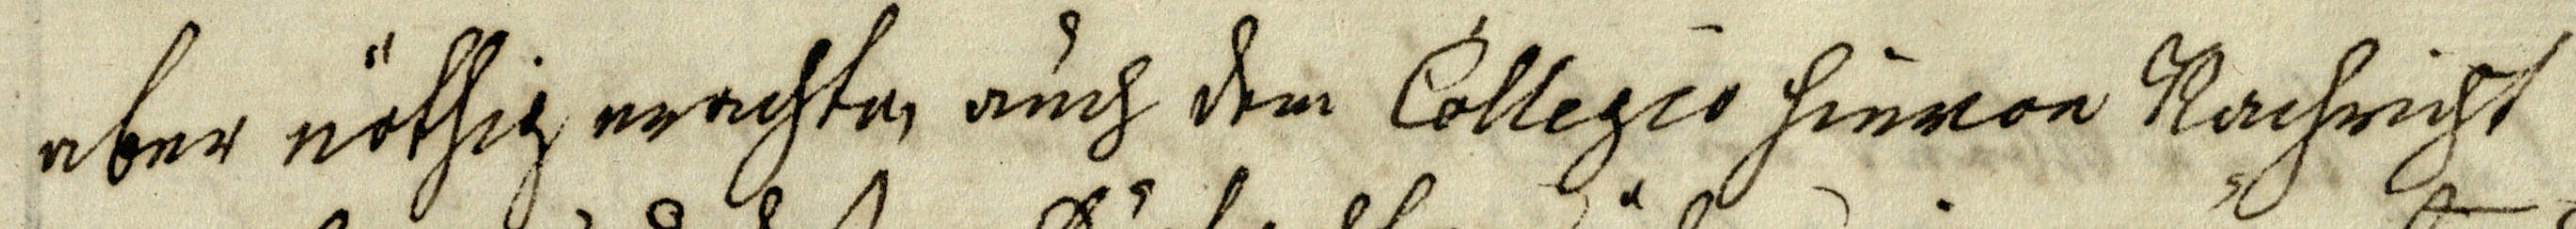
aber nöthig erachte, auch dem Collegio hievon Nachricht
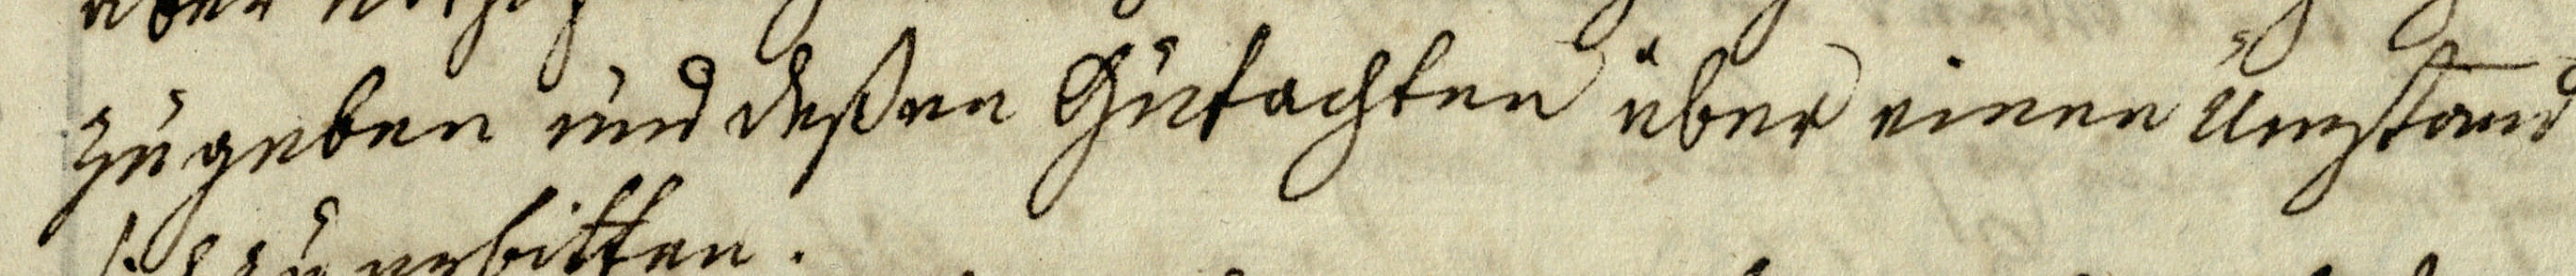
zu geben und deßen Gutachten über einen Umstand
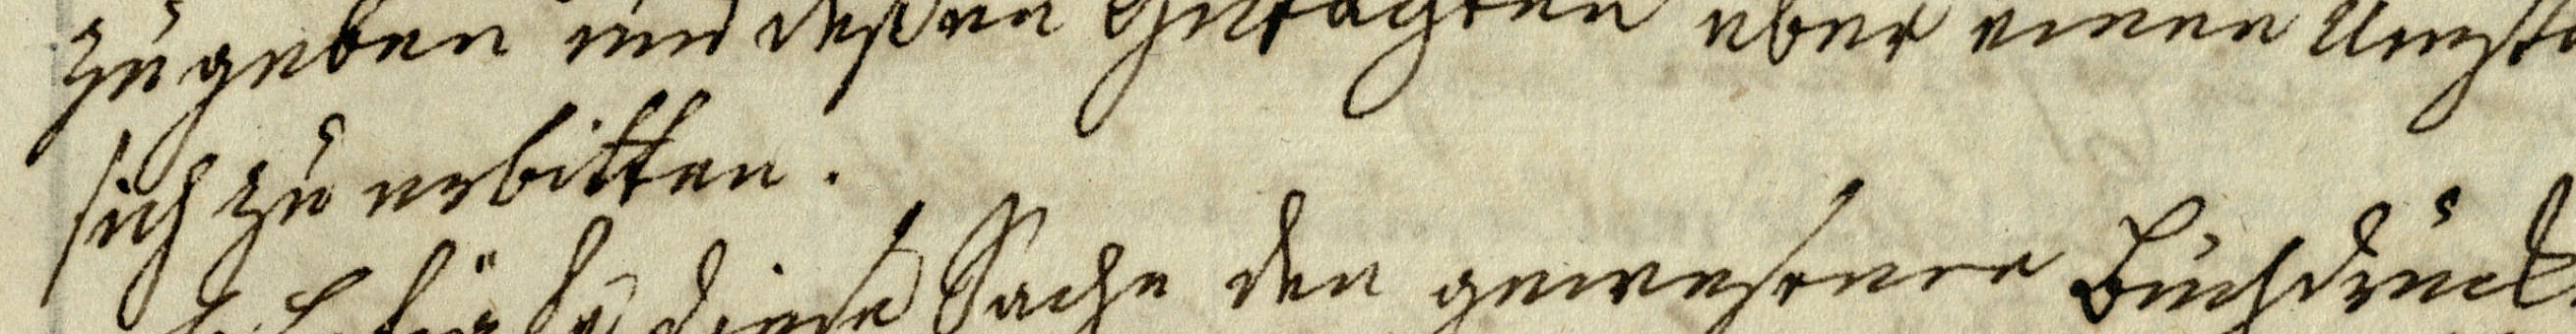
sich zu erbitten.
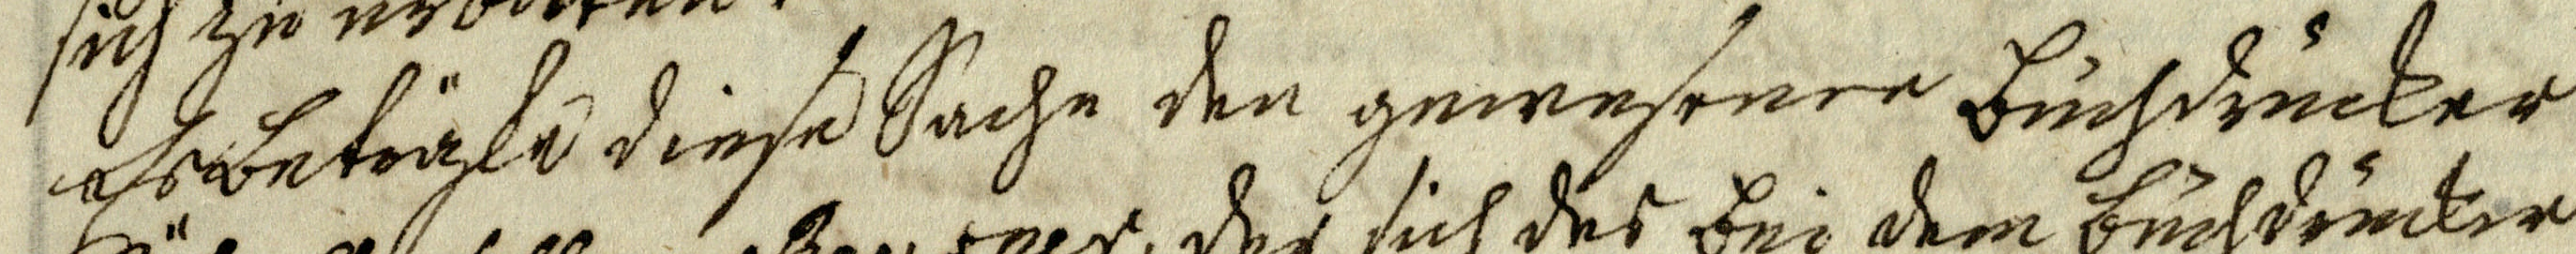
Es beträfe diese Sache den gewesenen Buchdrucker
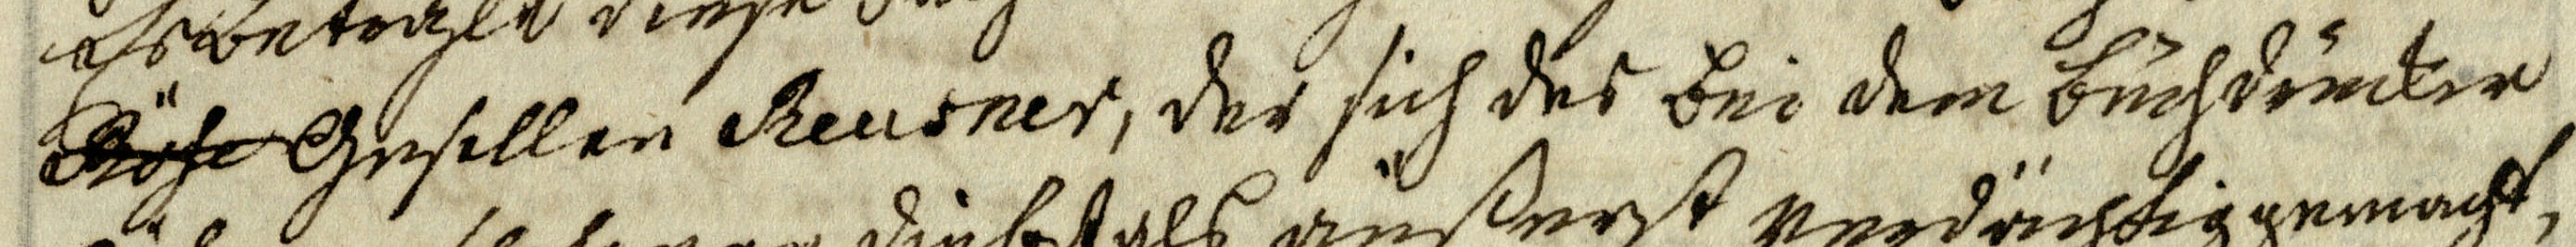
Röse Gesellen Reusner, der sich des bei dem Buchdrucker
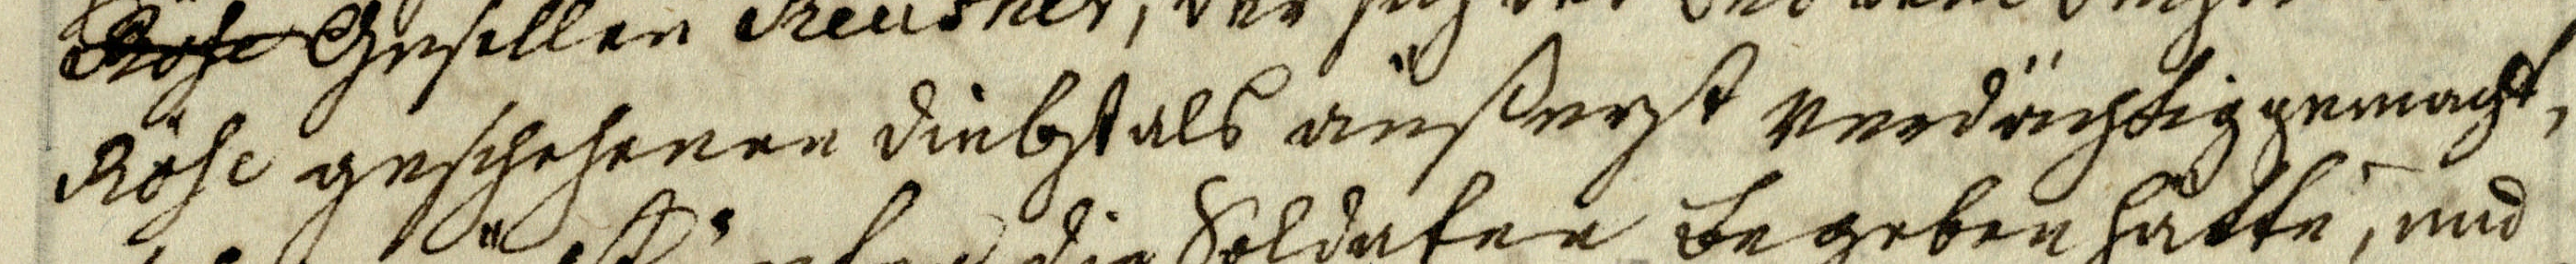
Röse geschehenen Diebstahls äußerst verdächtig gemacht,
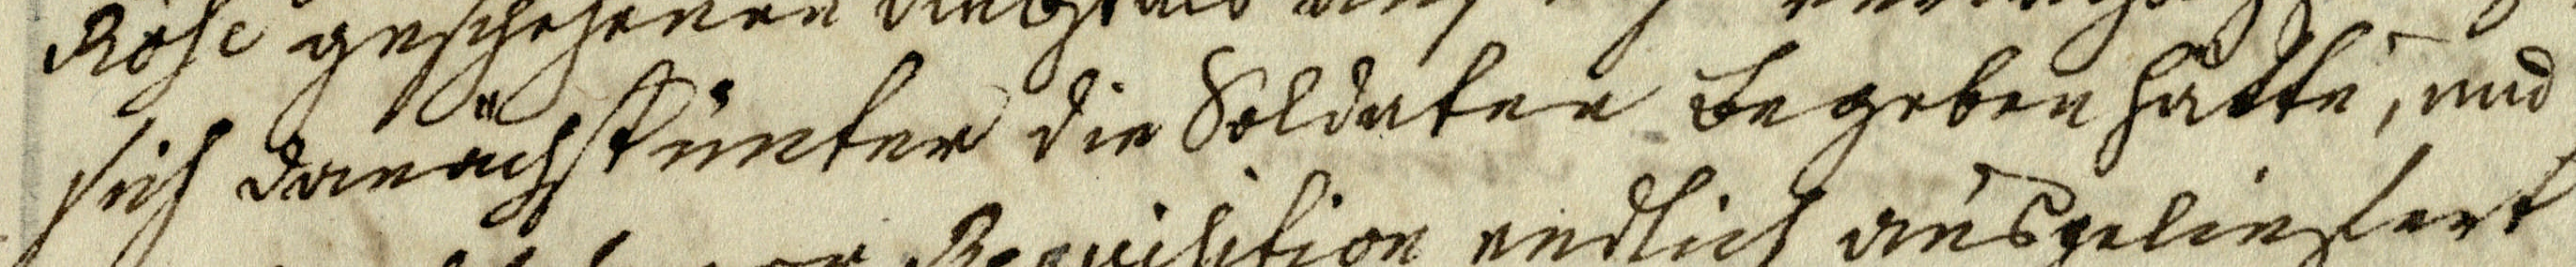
sich danächst unter die Soldaten begeben hätte, und
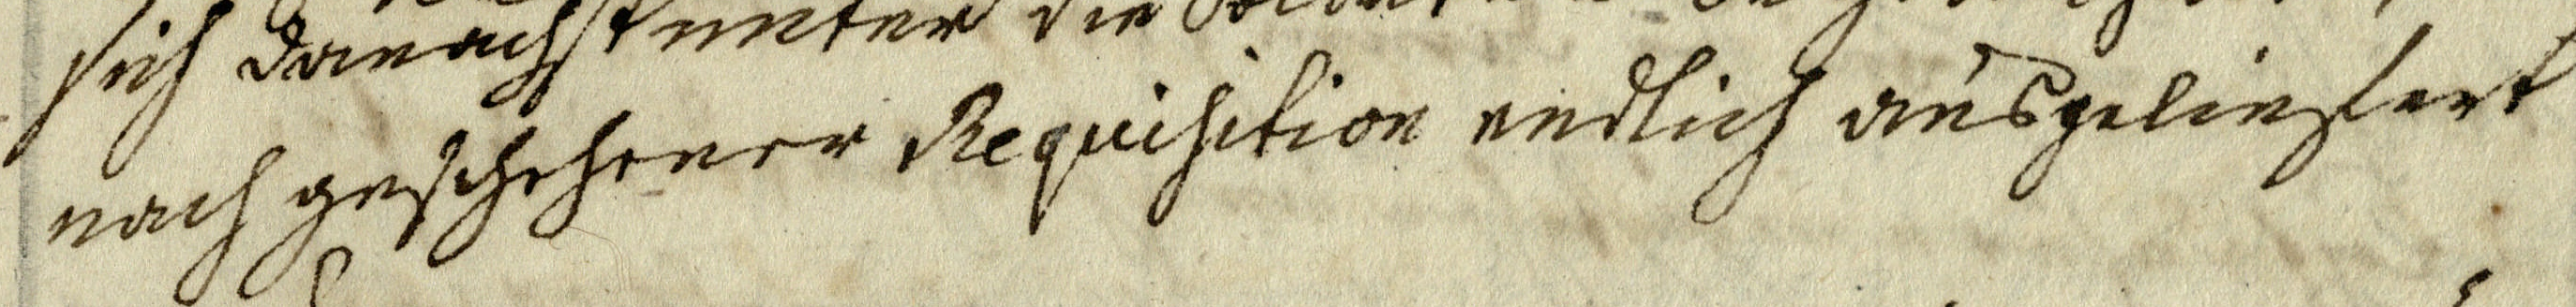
nach geschehener Requisition endlich ausgeliefert
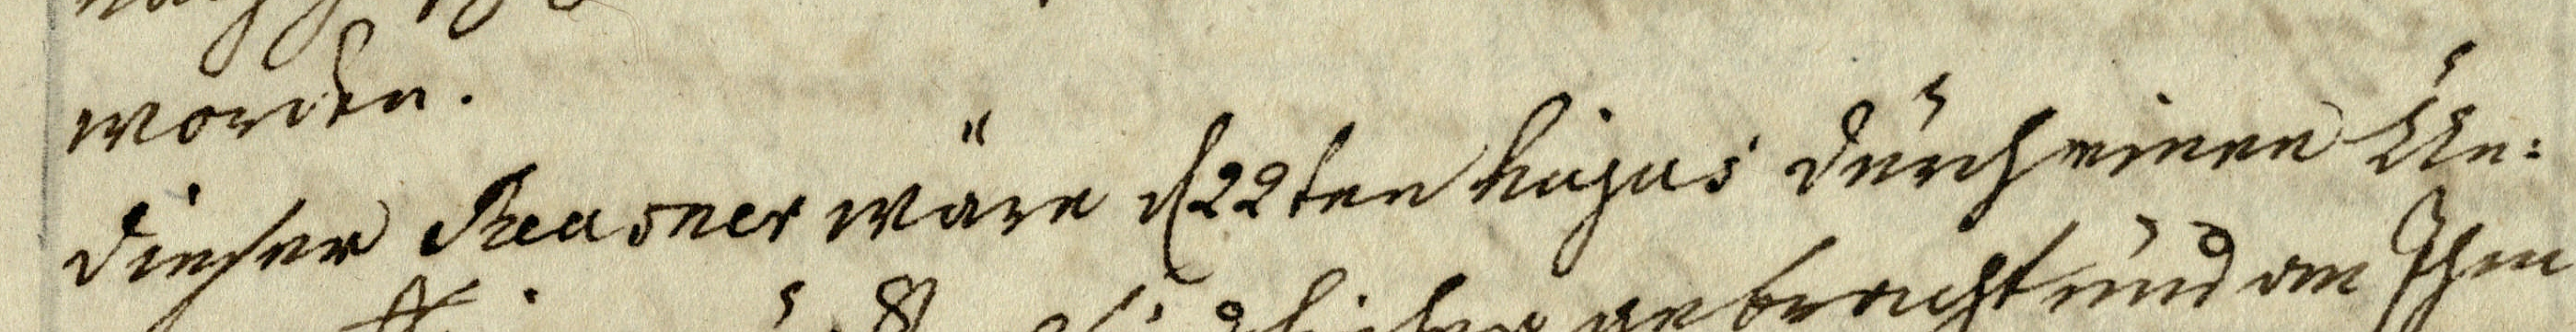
Dieser Reusner wäre d. 22 ten hujus durch einen Un¬
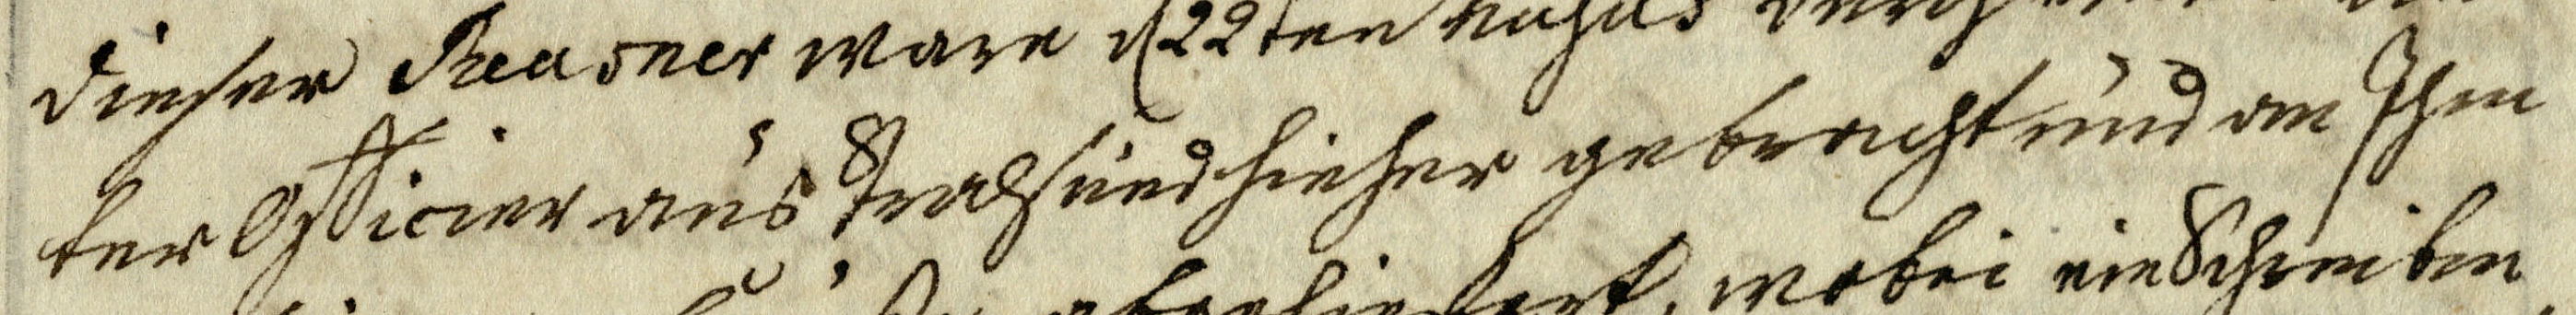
ter Officier aus Stralsund hieher gebracht und von Ihm
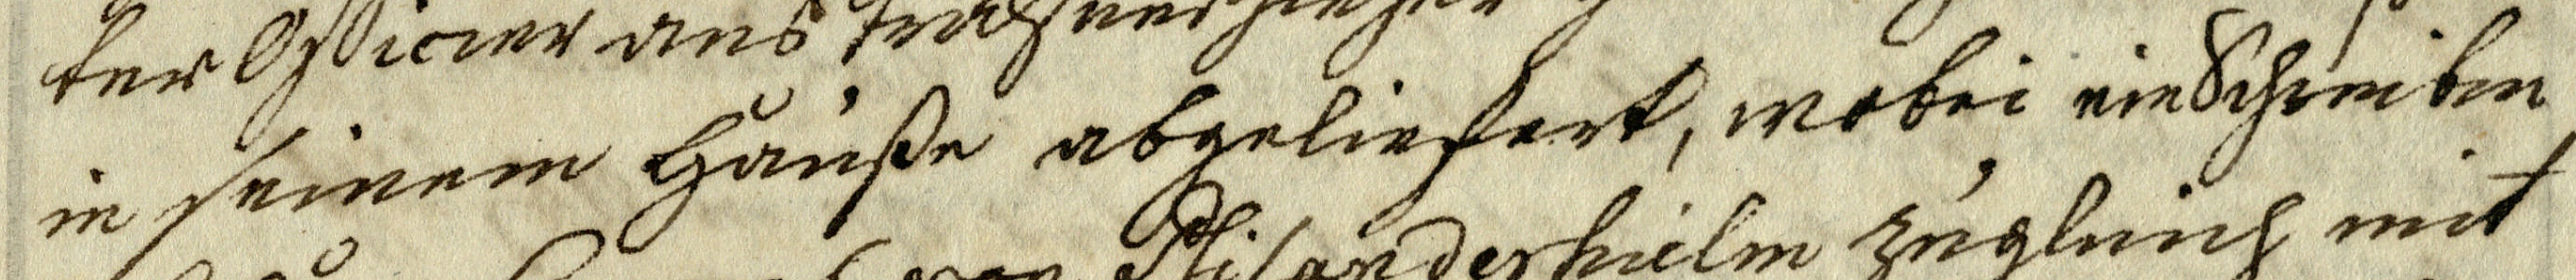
in seinem Hauße abgeliefert, wobei ein Schreiben
